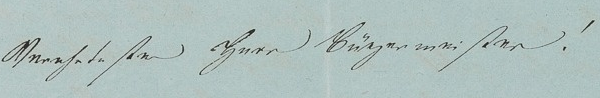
Verehrtester Herr Bürgermeister!
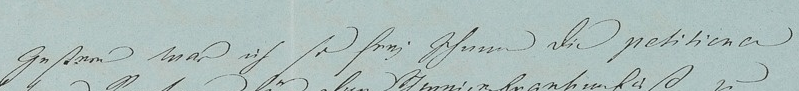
Gestern war ich so frei, Ihnen die petitionen
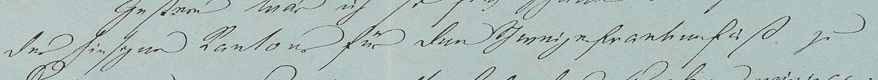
des hiesigen Kantons für den Schweizerfrankenfuß zu
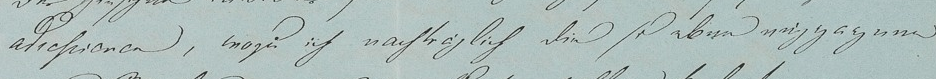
adressieren, wozu ich nachträglich die so eben eingegangene
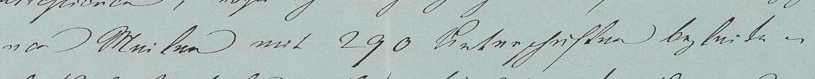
von Meilen mit 290 Unterschriften begleite.
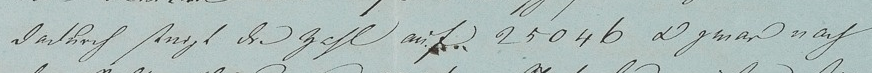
Dadurch steigt die Zahl auf 25046 & zwar nach
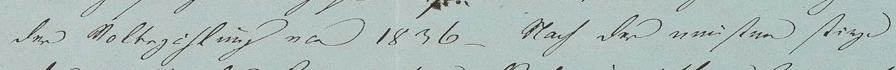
der Volkszählung von 1836 – Nach den meisten stiege
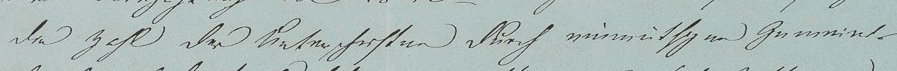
die Zahl der Unterschriften durch einmüthigen Gemeinds-
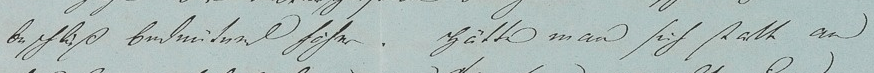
beschluß bedeutend höher. Hätte man sich statt an
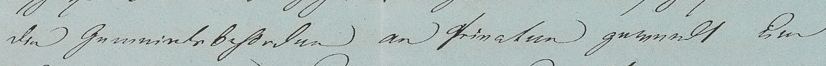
die Gemeindsbehörden an Privaten gewandt um
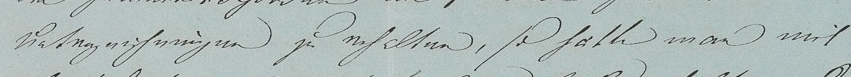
Unterzeichnungen zu erhalten, so hätte man mit
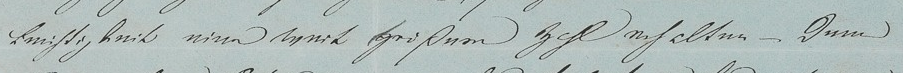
Leichtigkeit eine weit größere Zahl erhalten –– Denn
